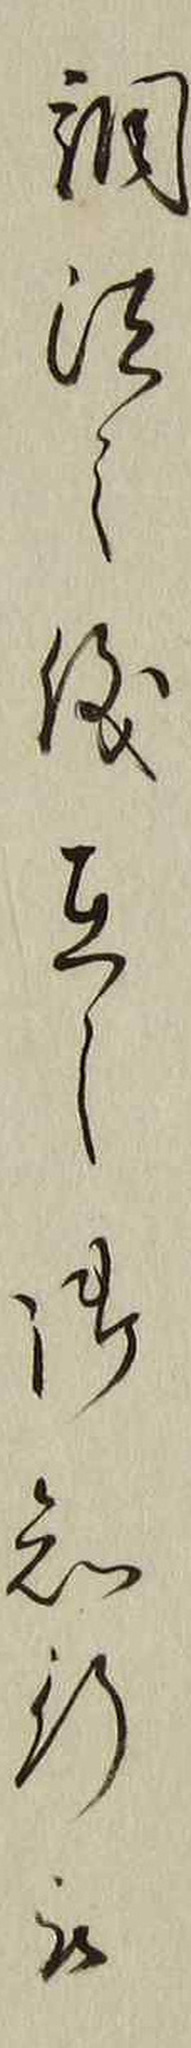調法之儀在之御知行被
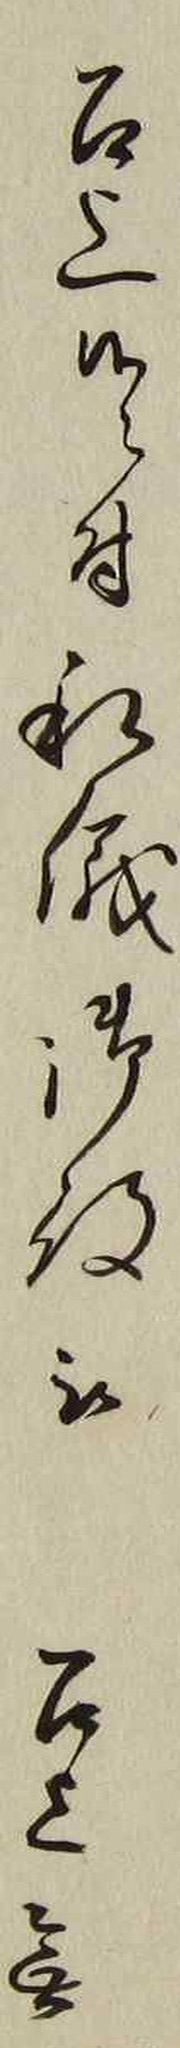召上候に付私儀御役被召上無
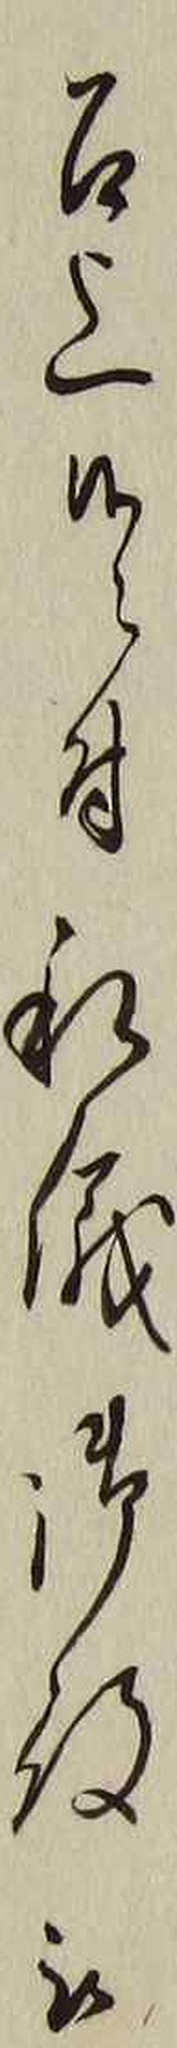召上候に付私儀御役被召上無
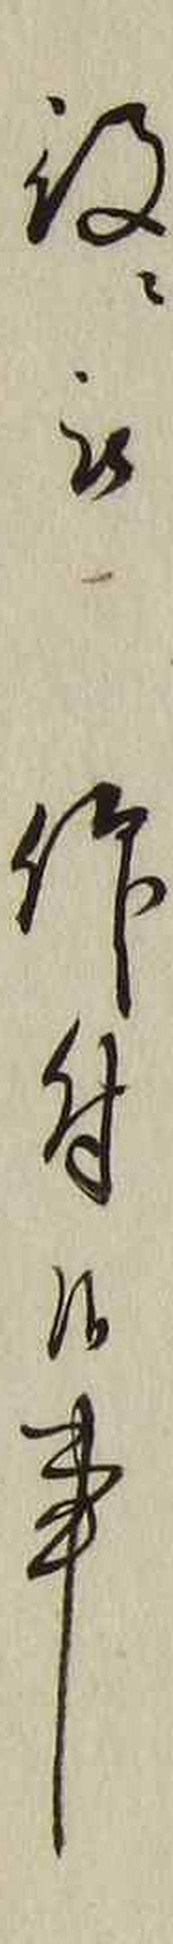役に被仰付候事

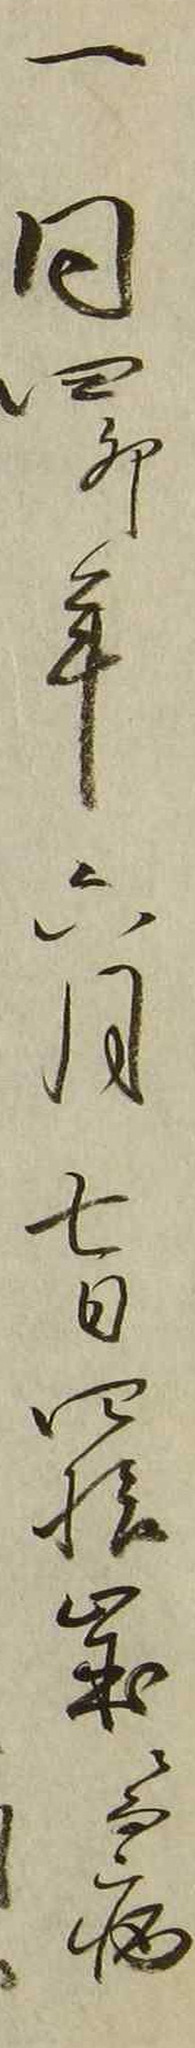一同四卯年六月七日四拾歳に而病
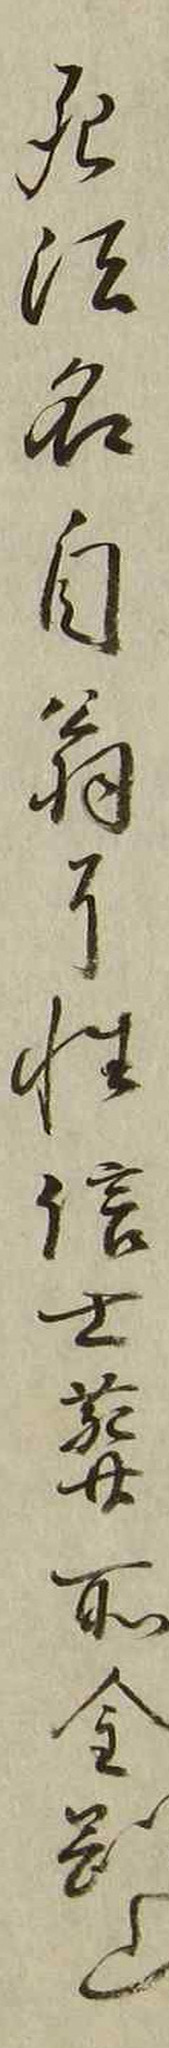死法名自翁了性信士葬所金剛山
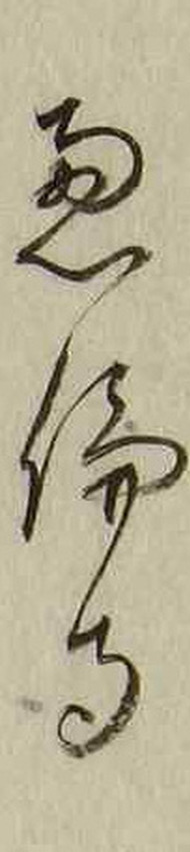恵倫寺
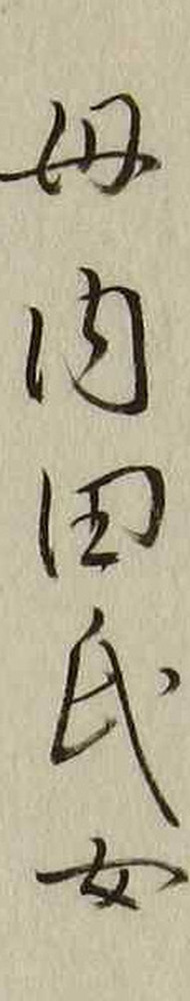母内田氏女
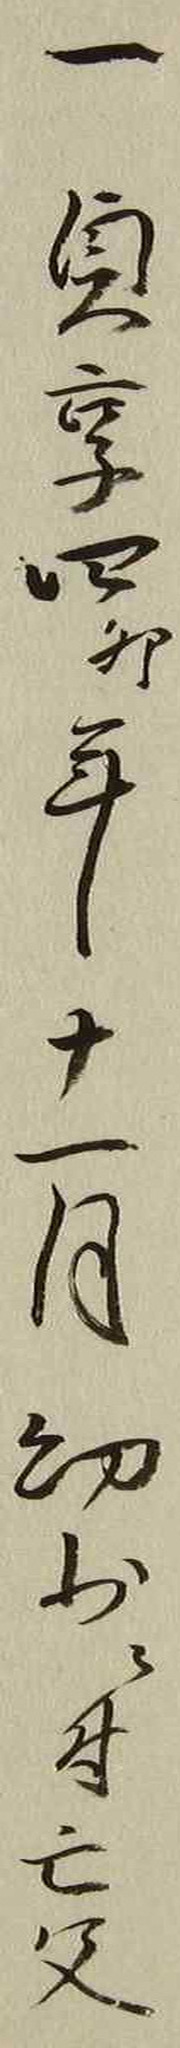一貞享四卯年十一月幼少に付亡父
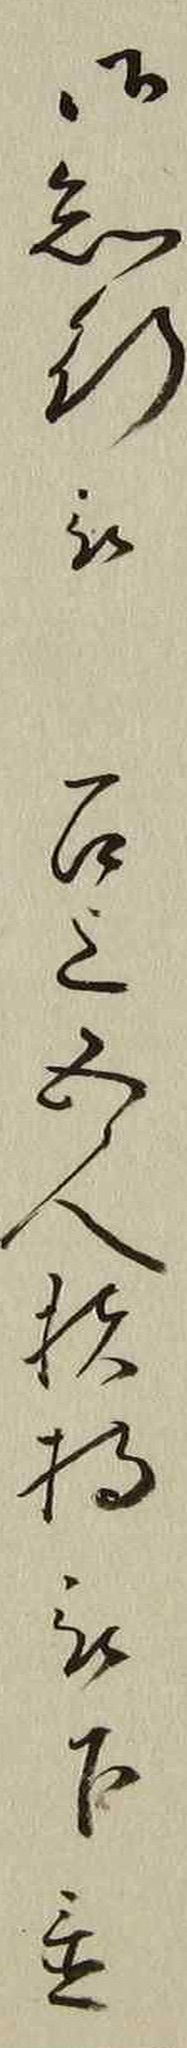御知行被召上五人扶持被下置
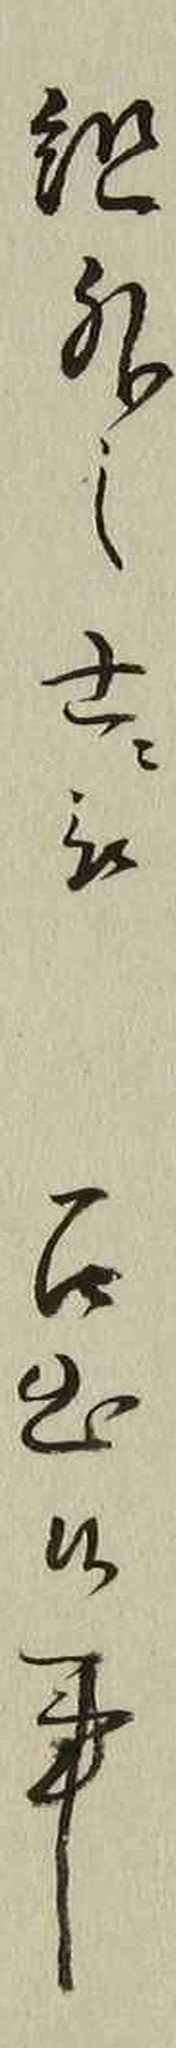組外之士に被召出候事
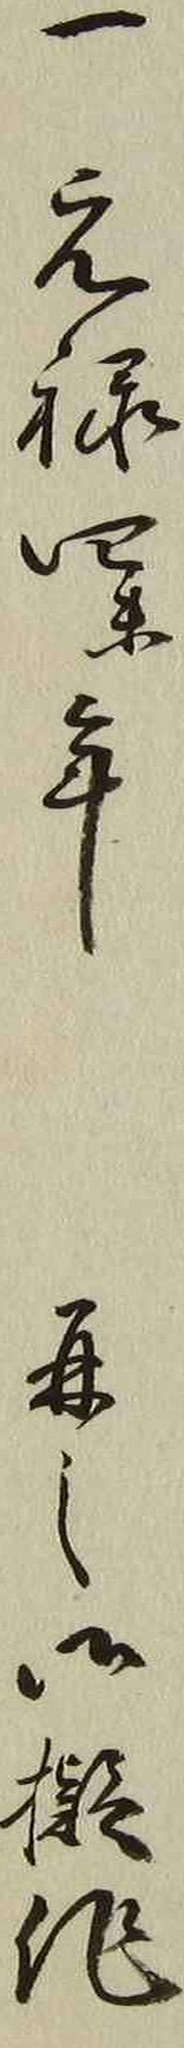一元禄四未年再之御擬作
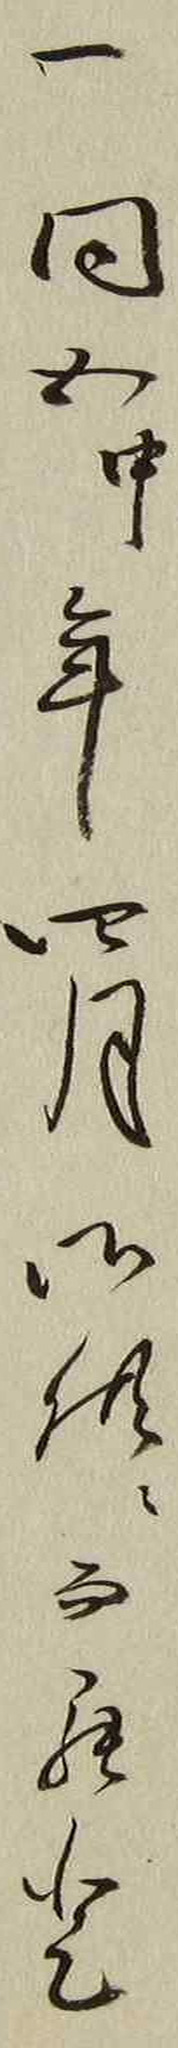一同五申年四月御供に而罷登
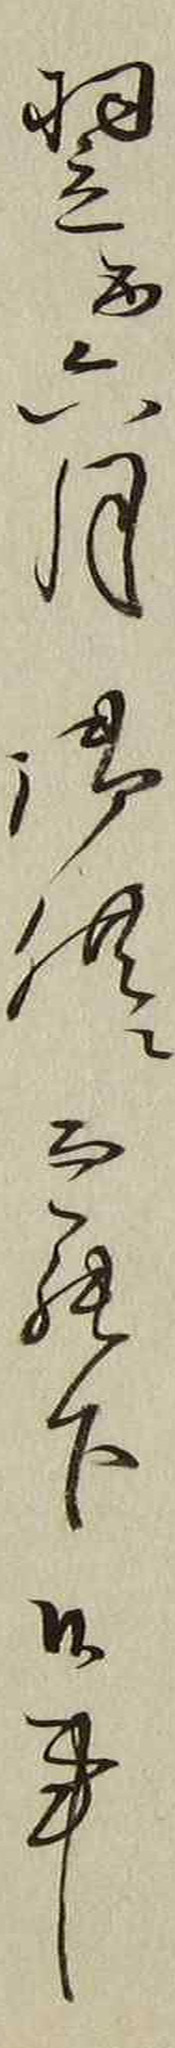翌酉六月御供に而罷下候事
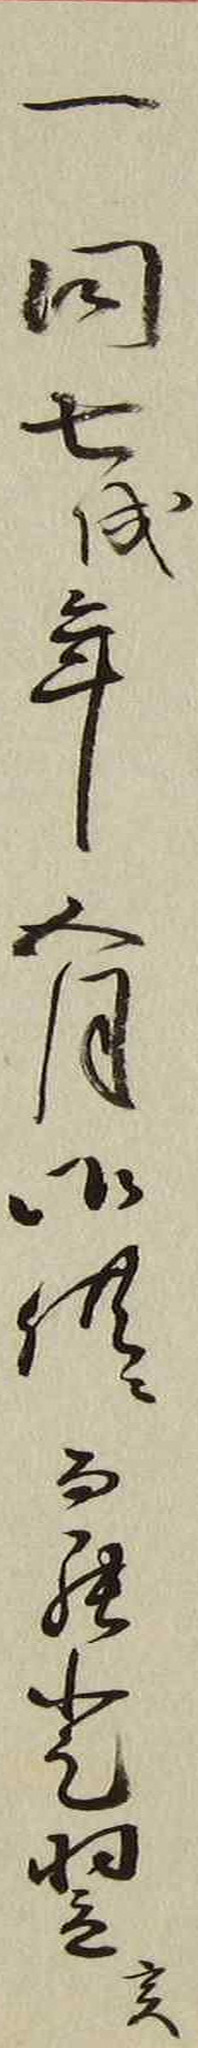一同七戌年五月御供に而罷登翌亥
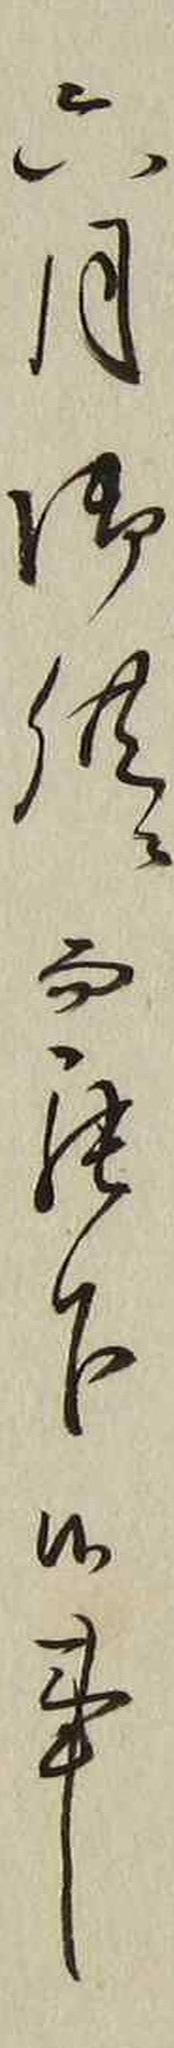六月御供に而罷下候事
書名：諸士系譜　巻之6　い之部6
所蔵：会津若松市立会津図書館
